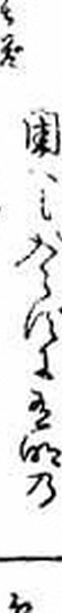閨へも入らずに有明の
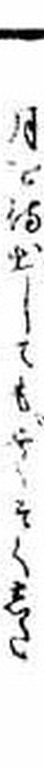月を待出してもやくそくした法
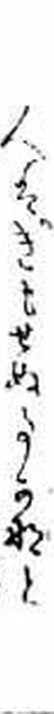人はきもせぬことかなと
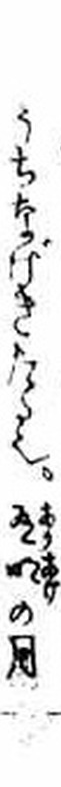うちなげきたる也有明の月師
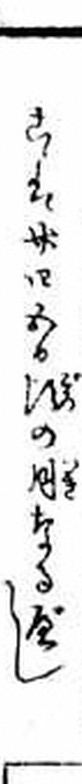これ廿四五日頃の月なるべし

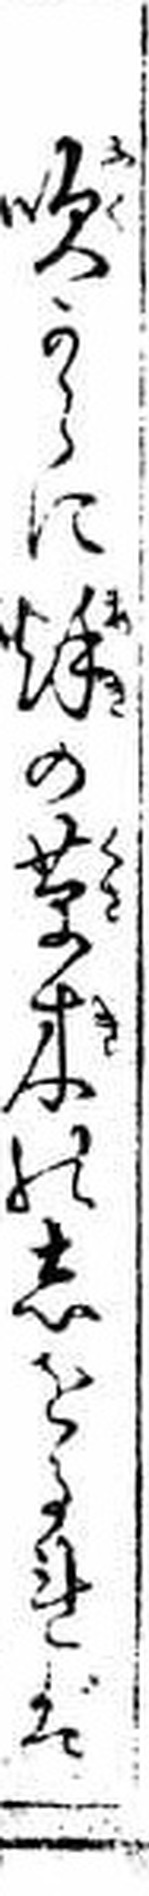吹からに秋の草木のしほるれば
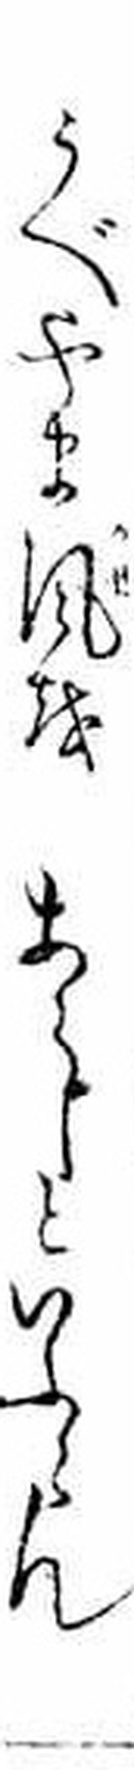うべ山風をあらしといふらん
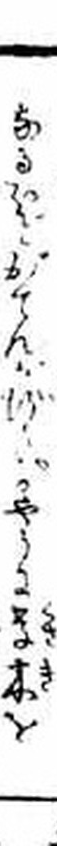なるほどがてんが行くかやうに草木を文
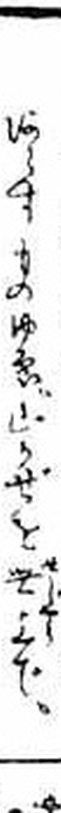あらすものゆへえゑ山かぜを世上で
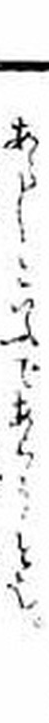あらしといふであらうと也屋
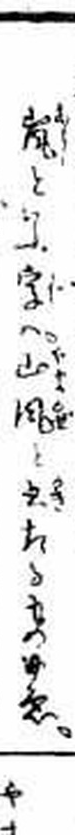嵐といふ字は山風と書たるものゆゑ
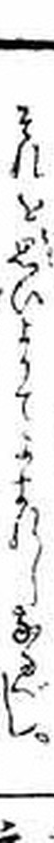それを思ひよりてよまれしなるべし康
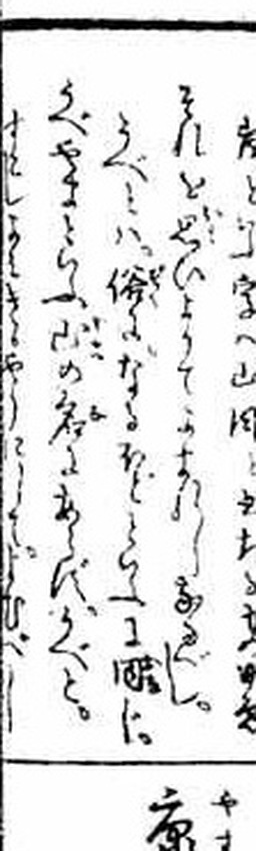うべとは俗になるほどといへるに同じ
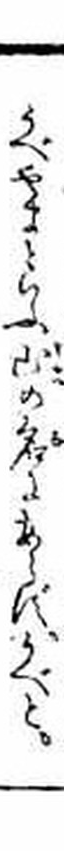うべやまといふ山の名にあらずうべと秀
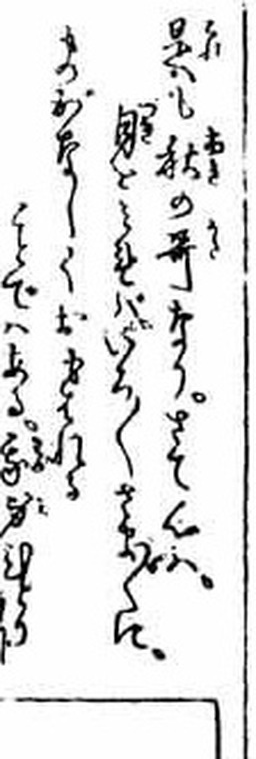月をみればいろ〳〵さま〳〵に
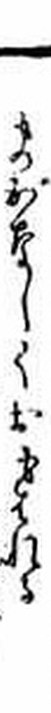ものがなしくおもはれる
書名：小倉百人一首
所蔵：東京学芸大学教育コンテンツアーカイブ
